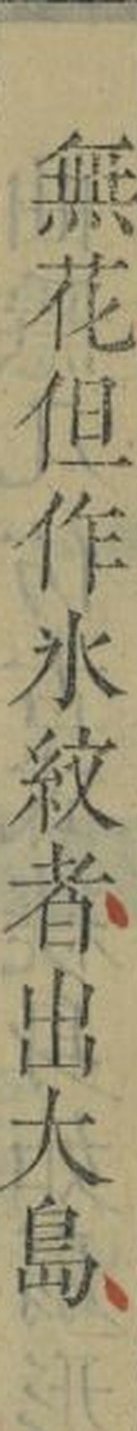無花但作氷紋者出大島
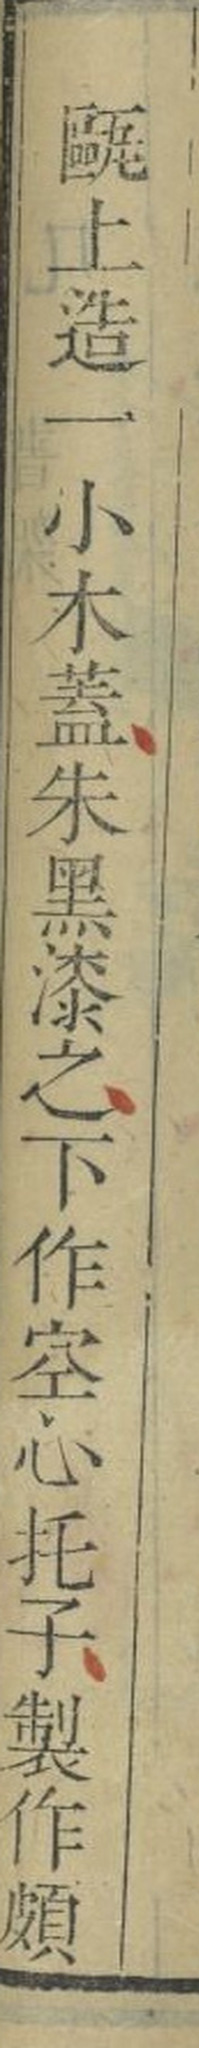甌上造一小木蓋朱黒漆之下作空心托子製作頗
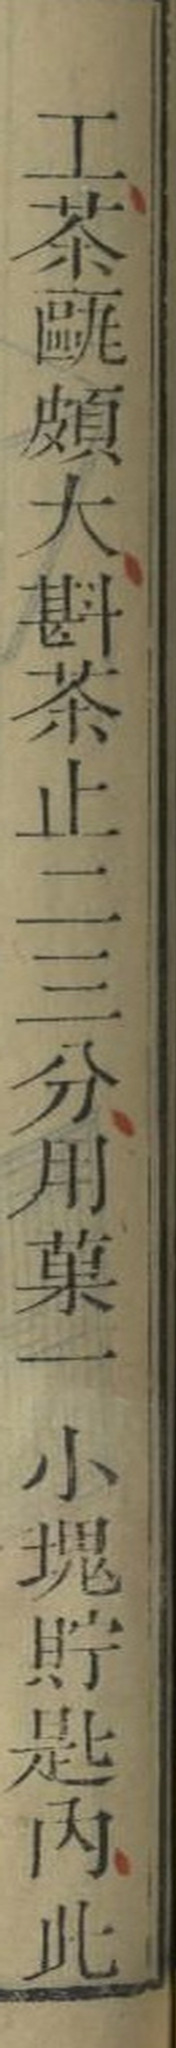工茶甌頗大斟茶止二三分用菓一小塊貯匙内此
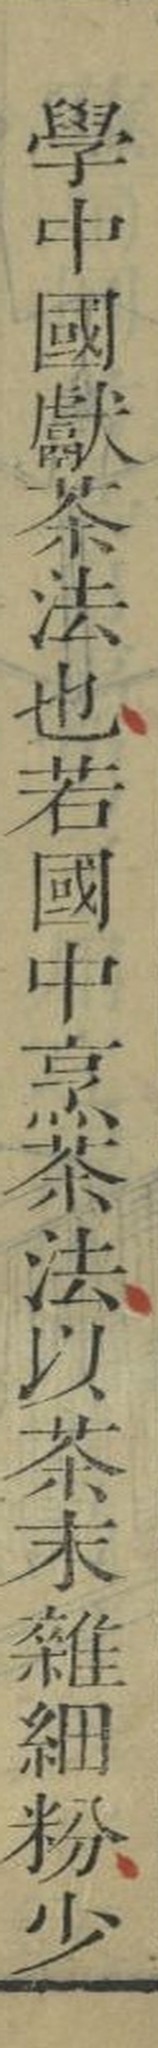学中国献茶法也若国中烹茶法以茶末雑細粉少
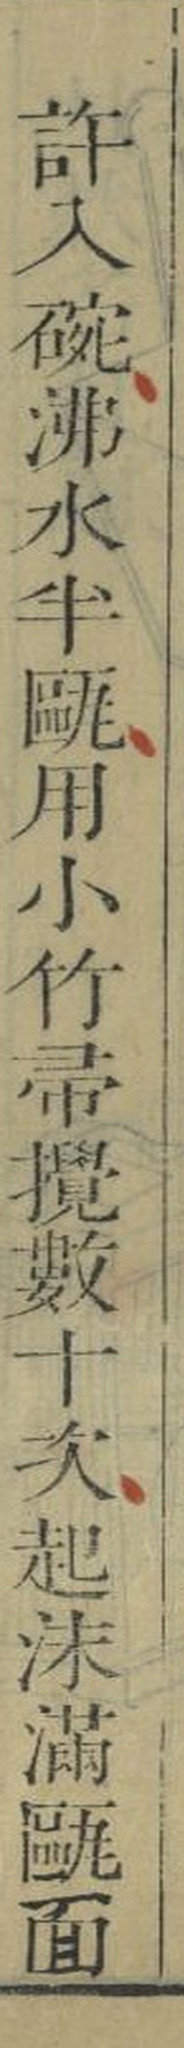許入碗沸水半甌用小竹帚攪数十次起沫満甌面
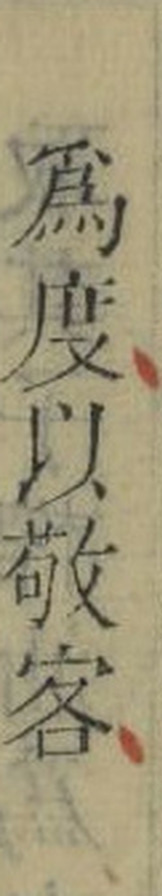為度以敬客

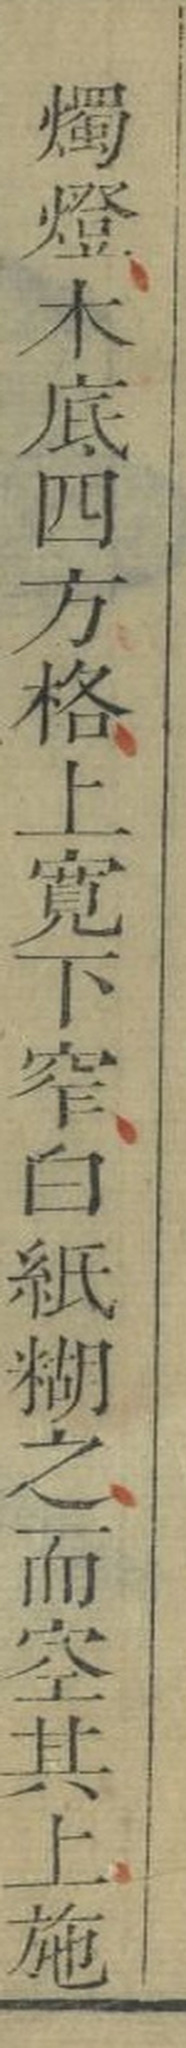燭灯木底四方格上寛下窄白紙糊之而空其上施
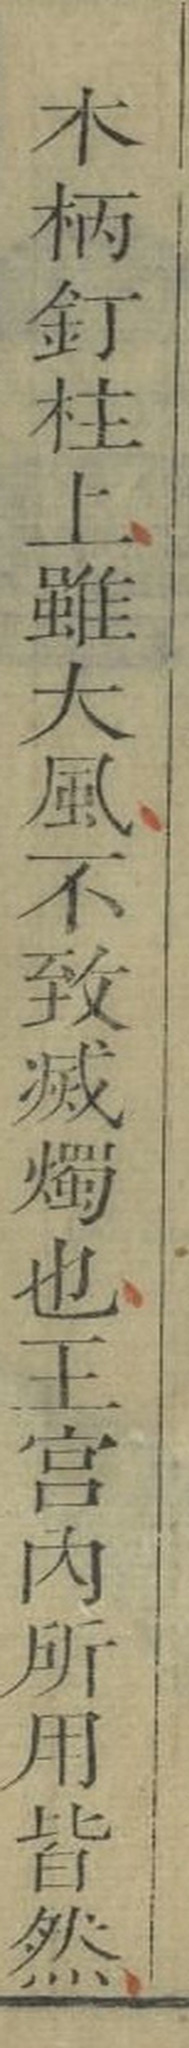木柄釘柱上雖大風不致滅燭也王宮内所用皆然
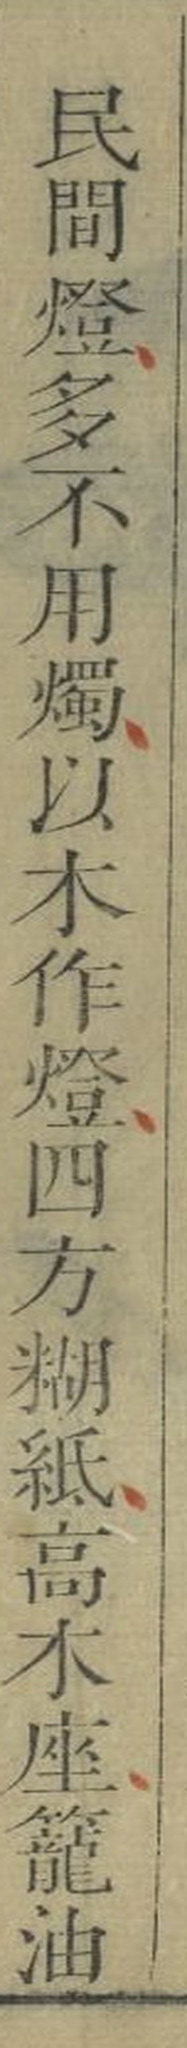民間灯多不用燭以木作灯四方糊紙高木座篭油
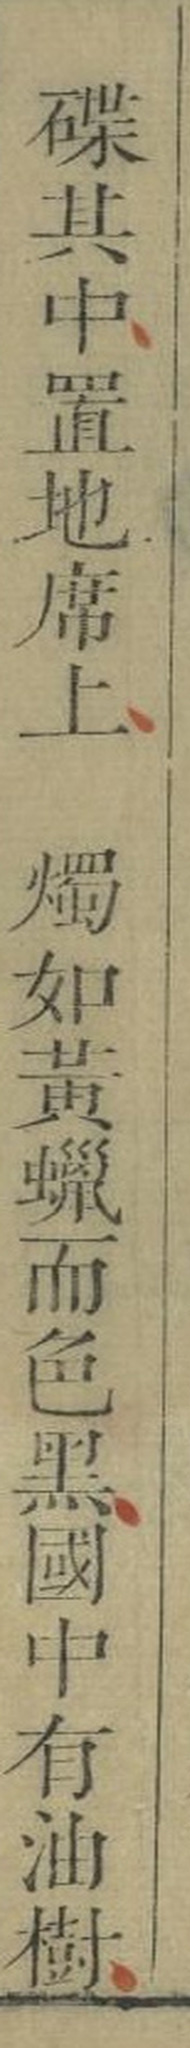碟其中置地席上燭如黄蝋而色黒国中有油樹
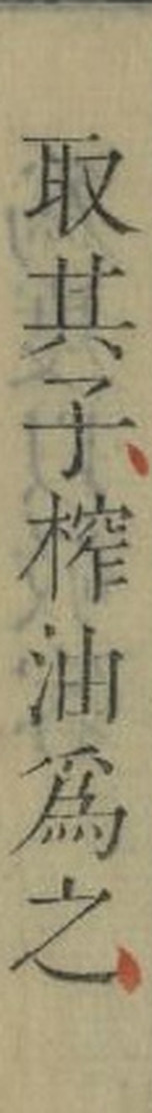取其子榨油為之
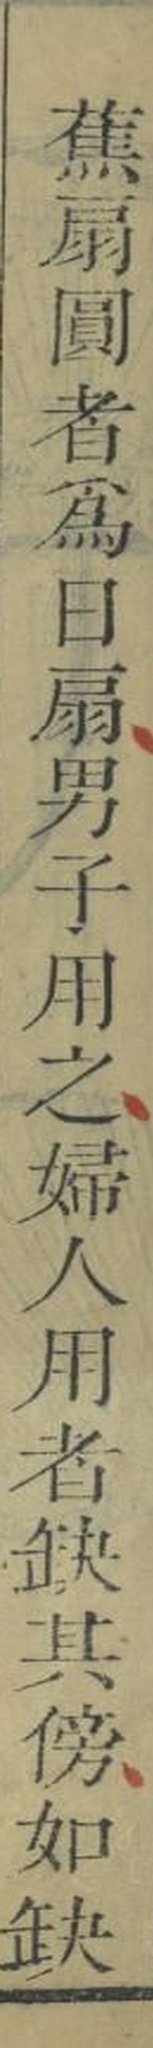蕉扇円者為日扇男子用之婦人用者欠其傍如欠
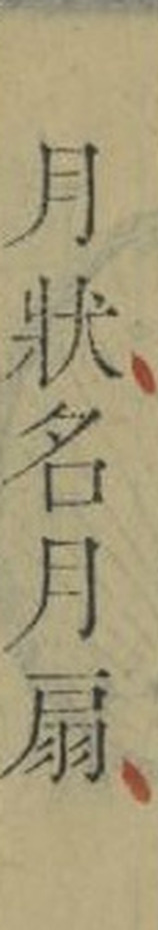月状名月扇
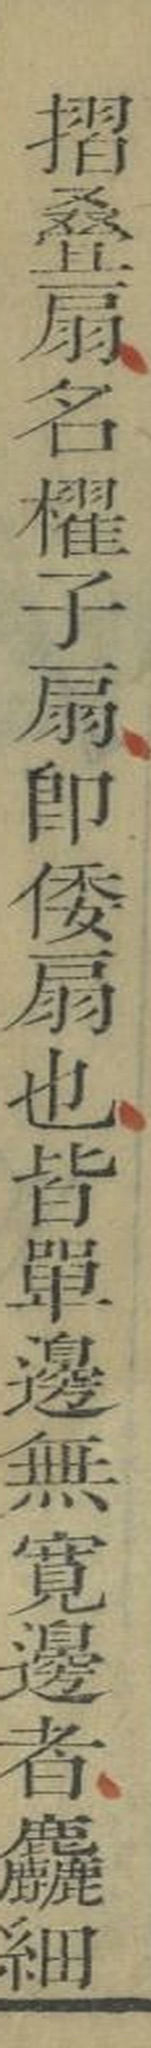摺畳扇名櫂子扇即倭扇也皆単辺無寛辺者麤細
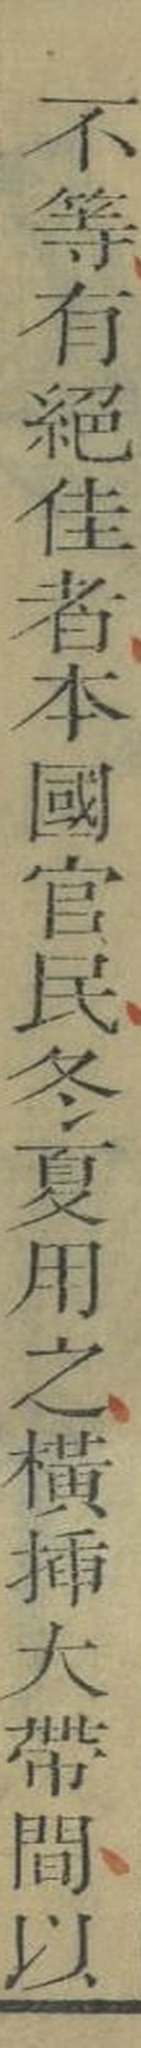不等有絶佳者本国官民冬夏用之横揷大帯間以
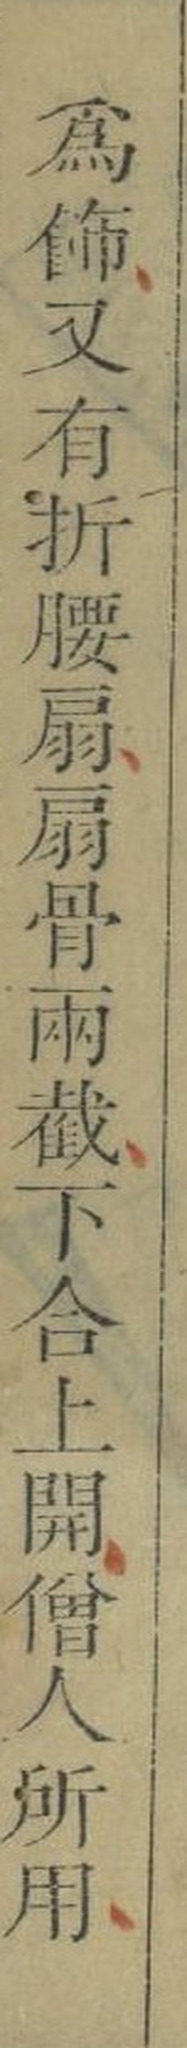為飾又有折腰扇扇骨両截下合上開僧人所用
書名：中山伝信録 巻六
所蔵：University of the Ryukyus Library
